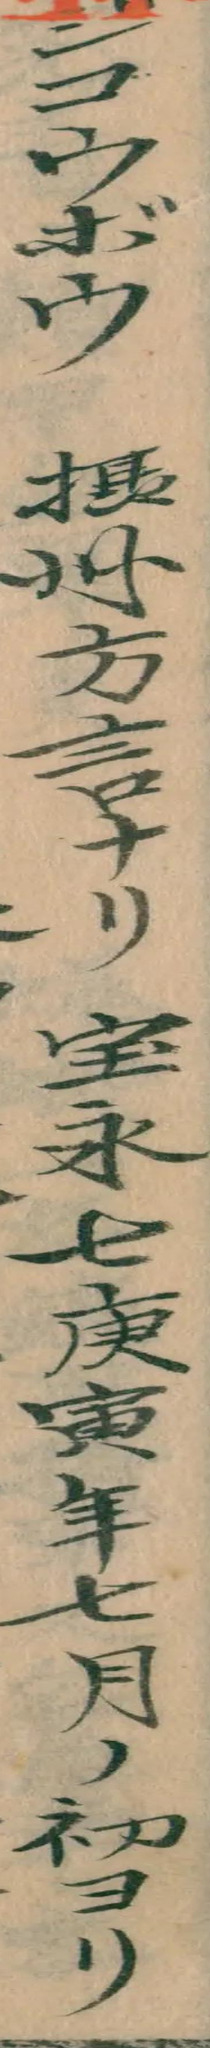ジコウボウ摂州方言ナリ宝永七庚寅年七月ノ初ヨリ
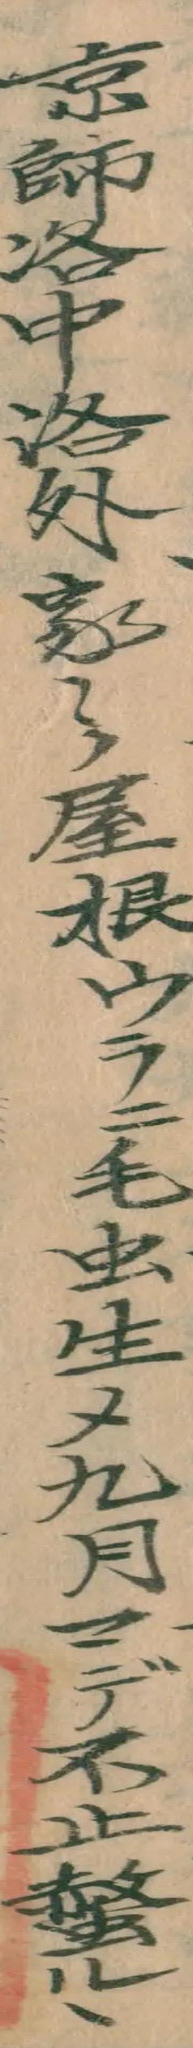京師洛中洛外家々ノ屋根ウラニ毛虫生シテ九月マデ不止螫ルヽ
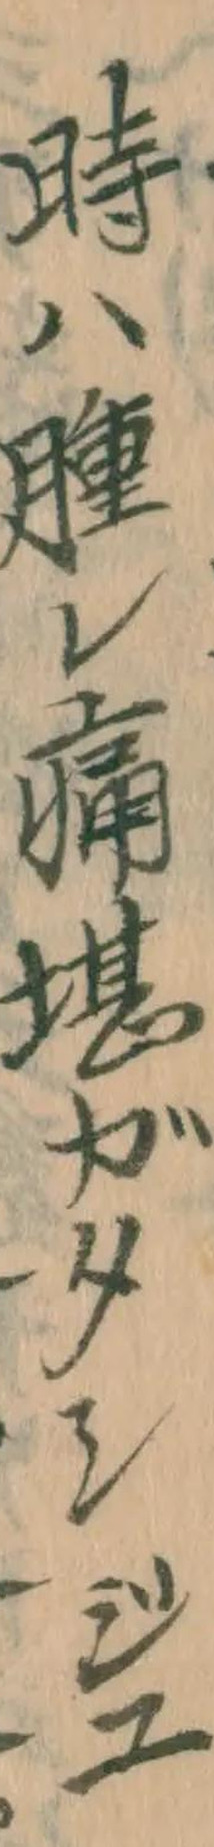時ハ腫レ痛堪ガタシジユ
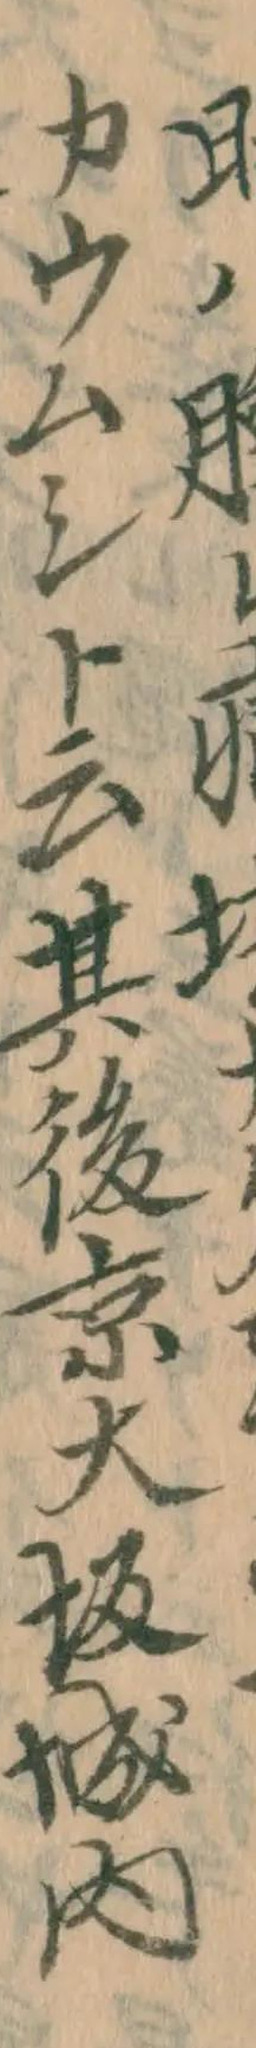カウムシト云其後京大坂城内
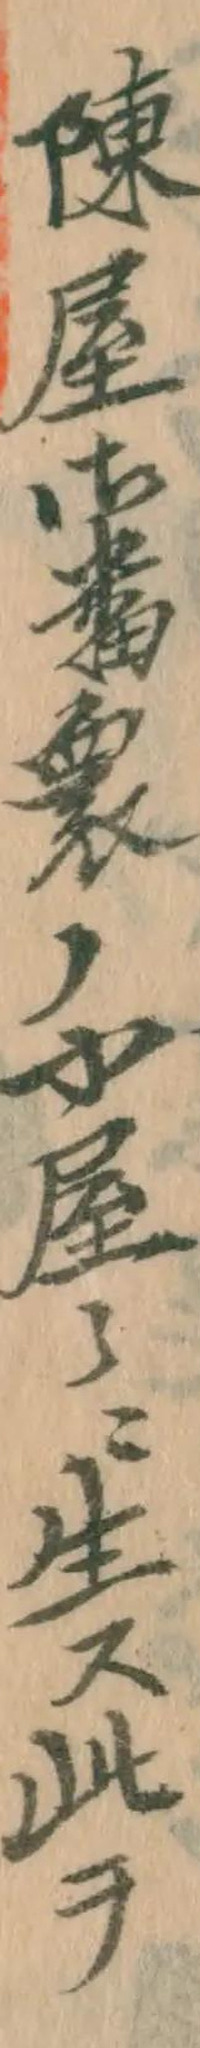陳屋御番衆ノ小屋々ニ生ス此ヲ
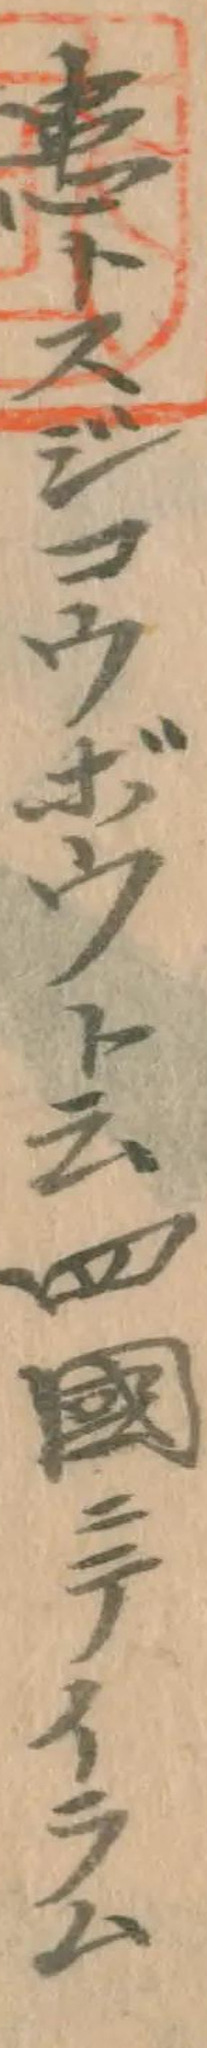患トスジコウボウト云四國ニテイラム
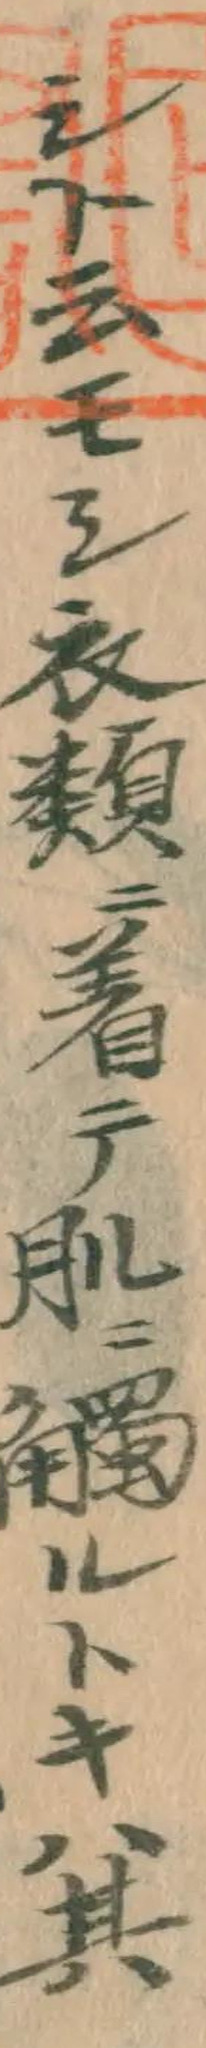シト云モシ衣類ニ着テ肌ニ觸ルトキハ其
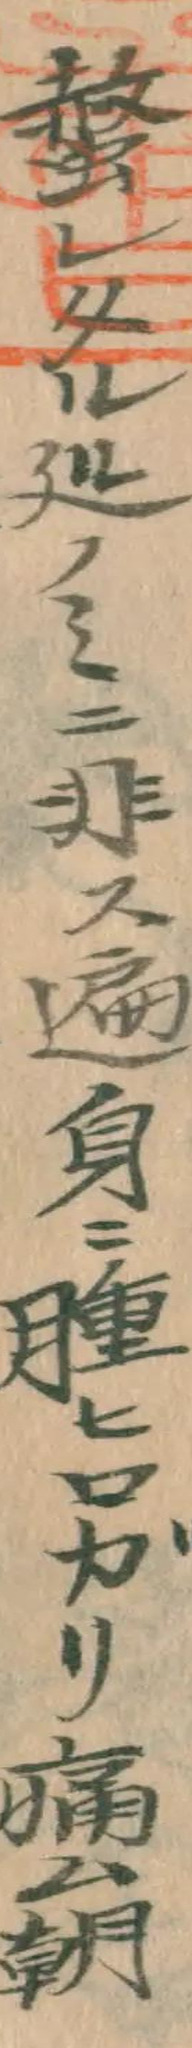螫レタル処ノミニ非ス遍身ニ腫ヒロガリ痛ム朝
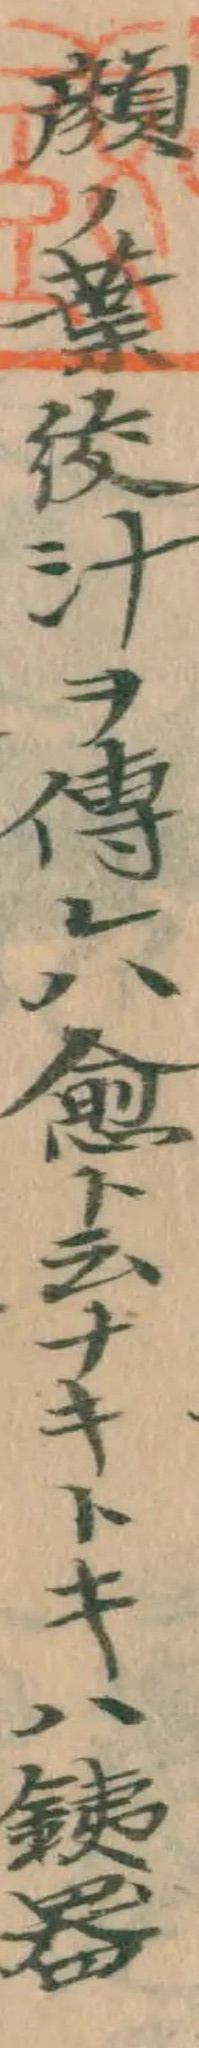顔ノ葉絞汁ヲ傅レハイ愈ト云ナキトキハ銕器
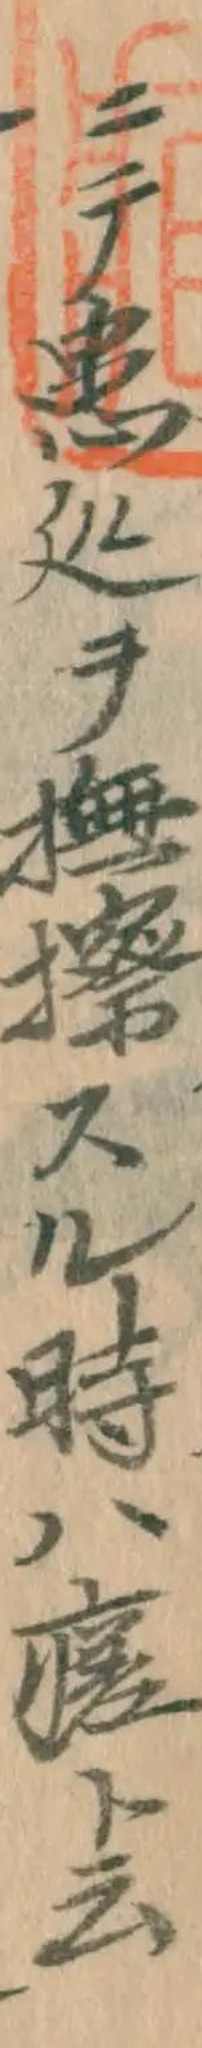ニテ患処ヲ撫擦スル時ハ瘥ト云
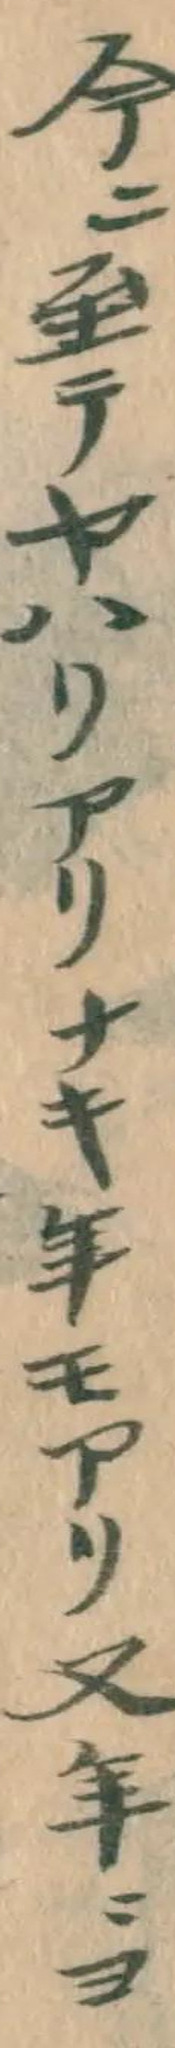今ニ至テヤハリアリナキ年モアリ又トシ年ニヨ
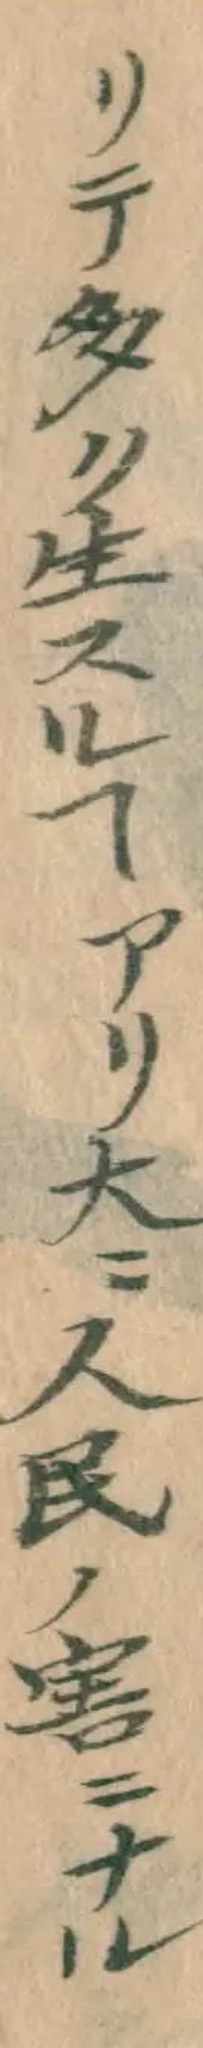リテ多ク生スルコトアリ大ニ人民ノ害ニナル
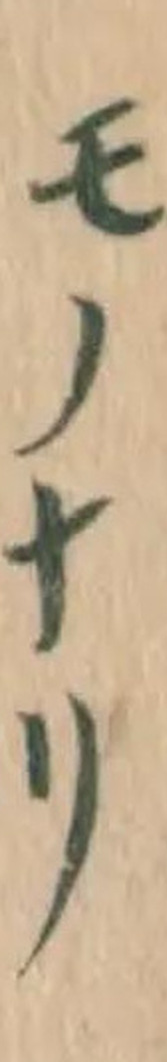モノナリ
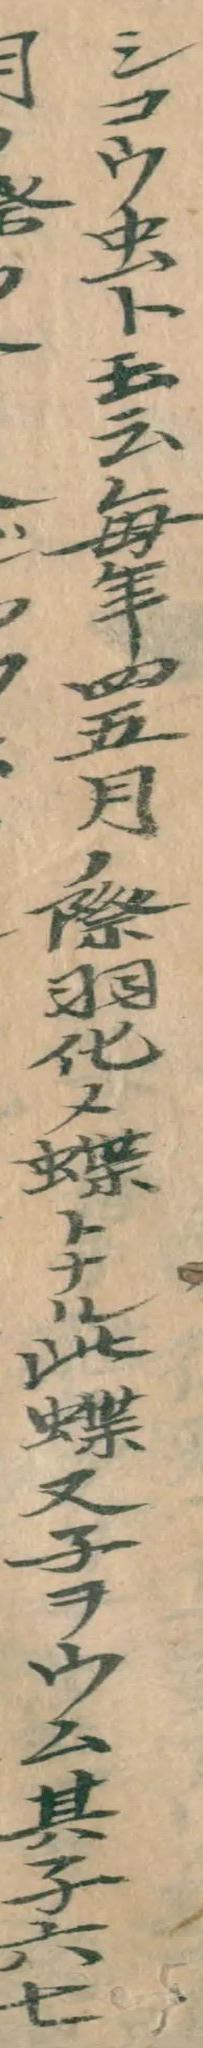シコウ虫トモ云毎年四五月ノ際羽化シテ蝶トナル此蝶又子ヲウム其子六七
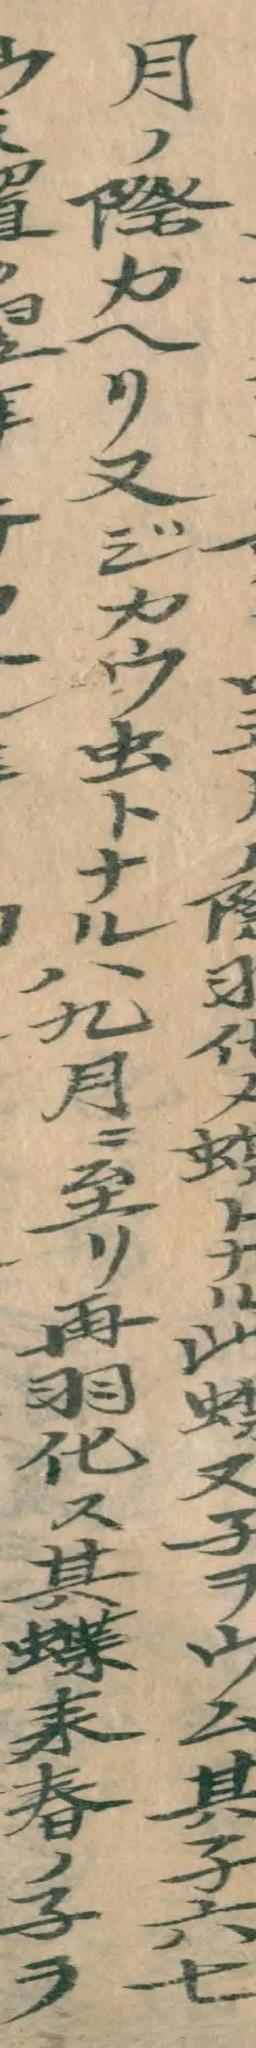月ノ際カヘリ又ジカウ虫トナル八九月ニ至リ再羽化ス其蝶来春ノ子ヲ
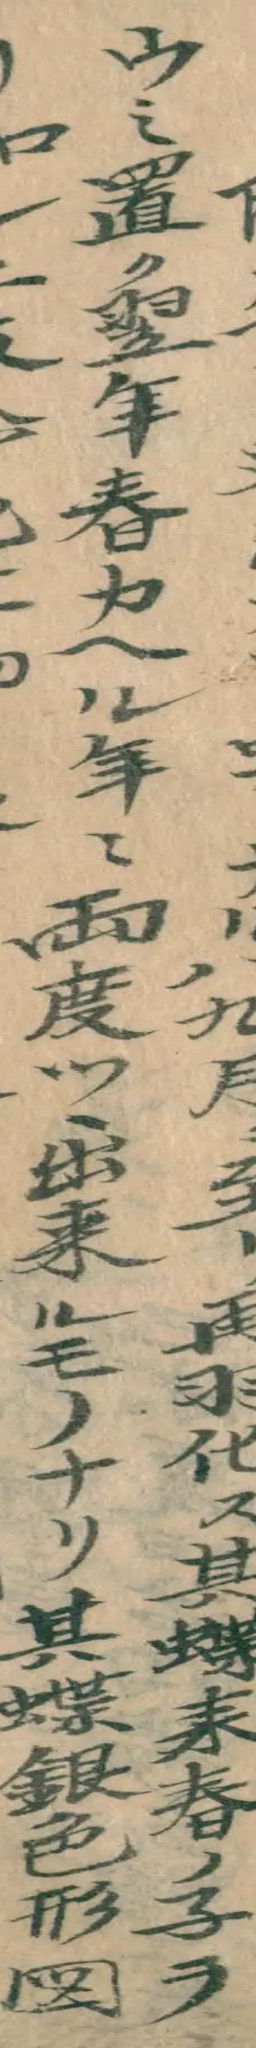ウミ置ク翌年春カヘル年ニ両度ツヽ出来ルモノナリ其蝶銀色形図
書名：千蟲譜 3巻. [2]
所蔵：国立国会図書館 National Diet Library, JAPAN
